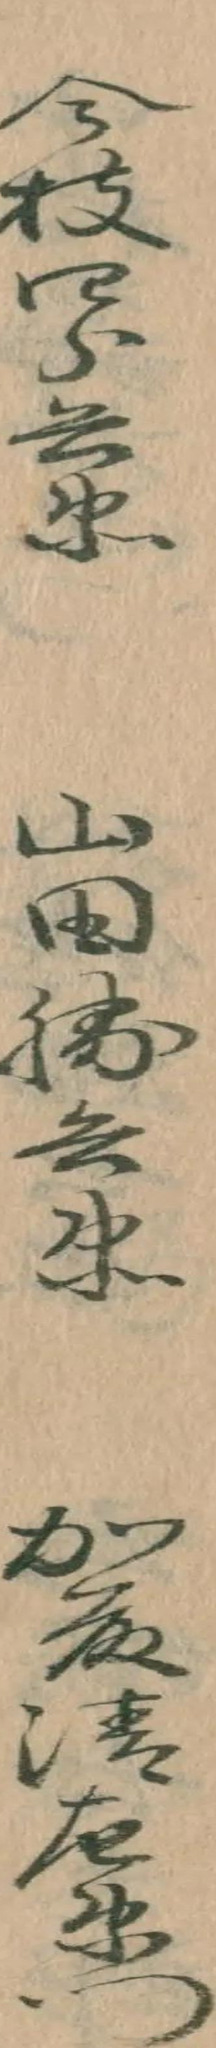今枝四郎兵衛山田勝兵衛加藤清左衛門
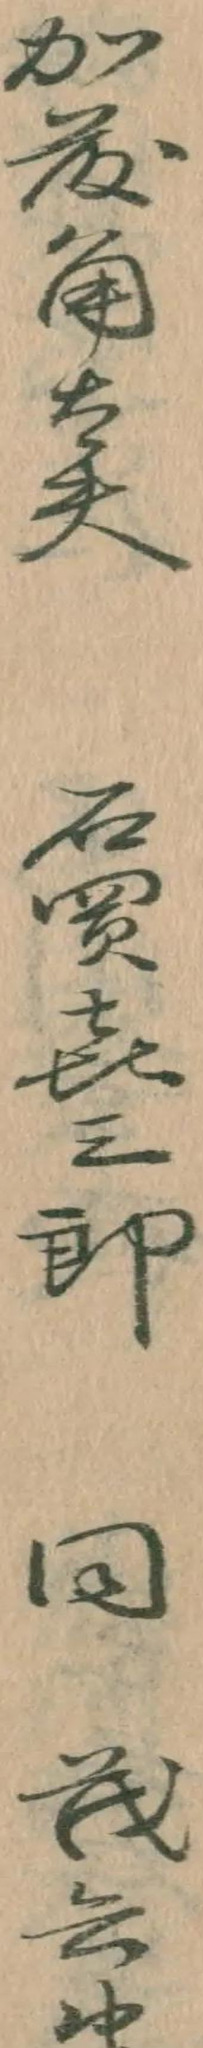加藤角太夫石買喜三郎同茂兵衛
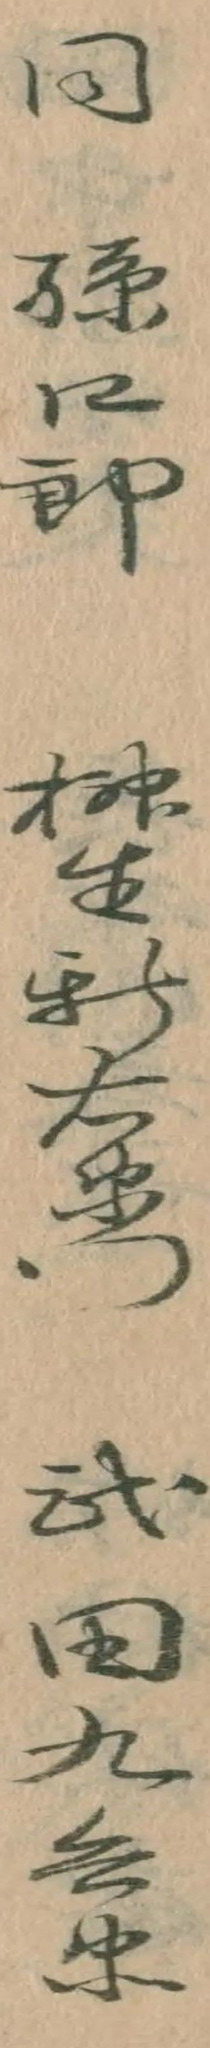同孫四郎榊生新右衛門武田九兵衛
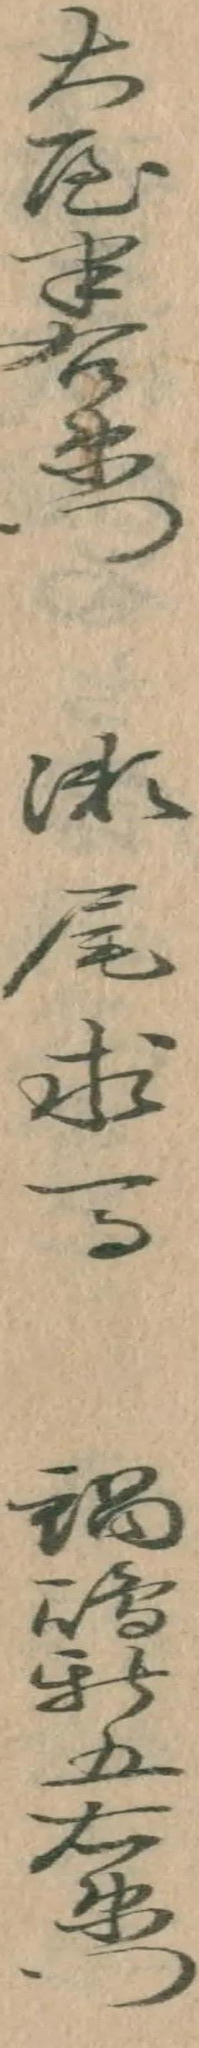大屋半右衛門瀬尾求馬鍋島新五右衛門
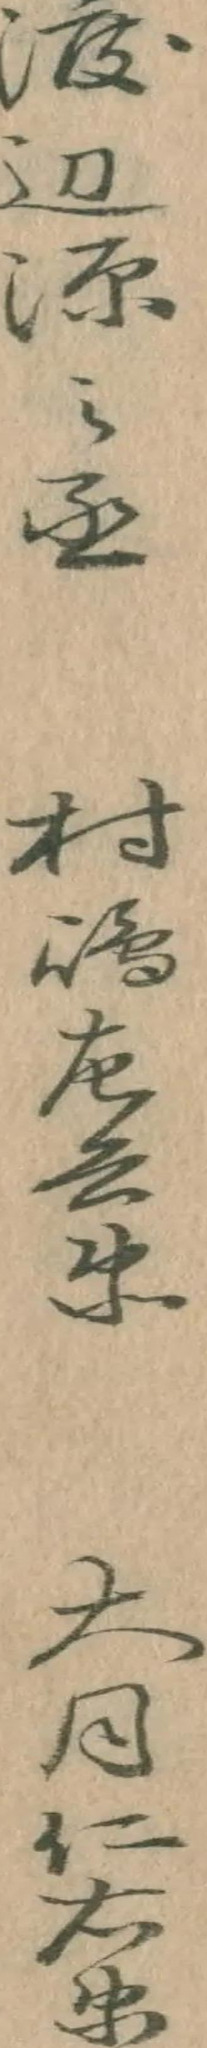渡辺源之丞村島左兵衛大月仁右衛門
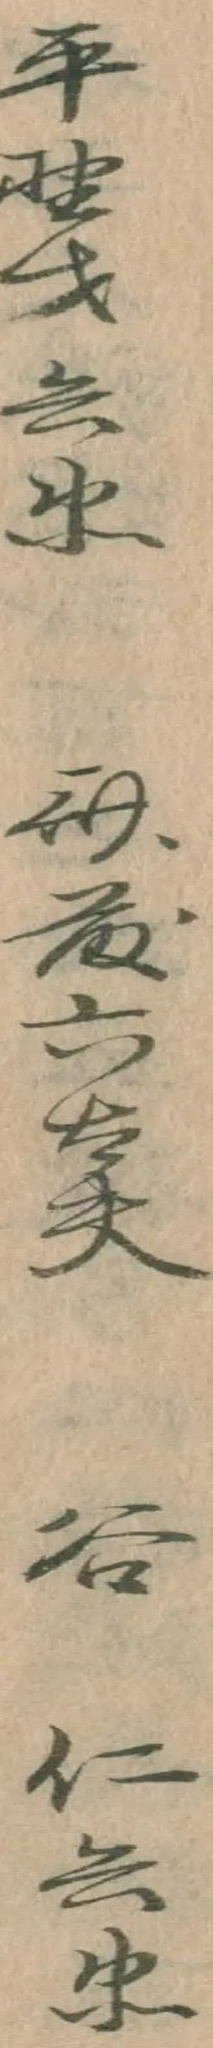平野才兵衛斎藤六太夫谷仁兵衛
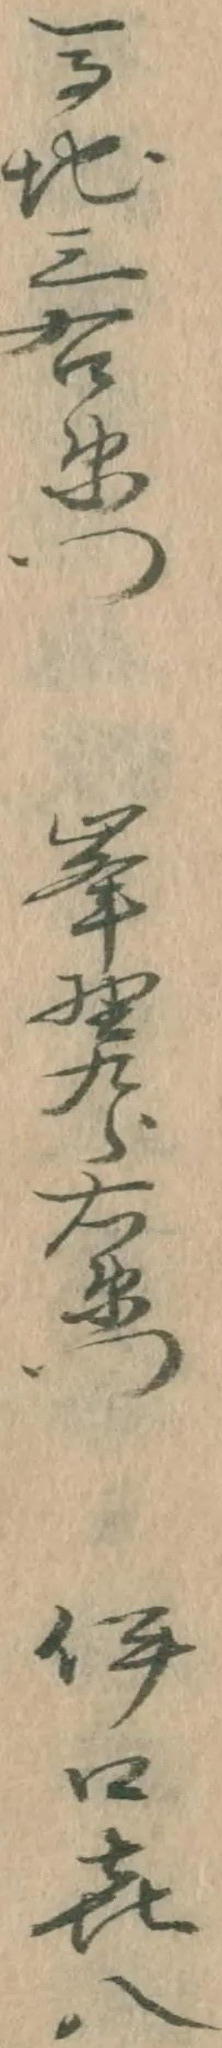馬地三右衛門峯野九郎右衛門伊口喜八郞
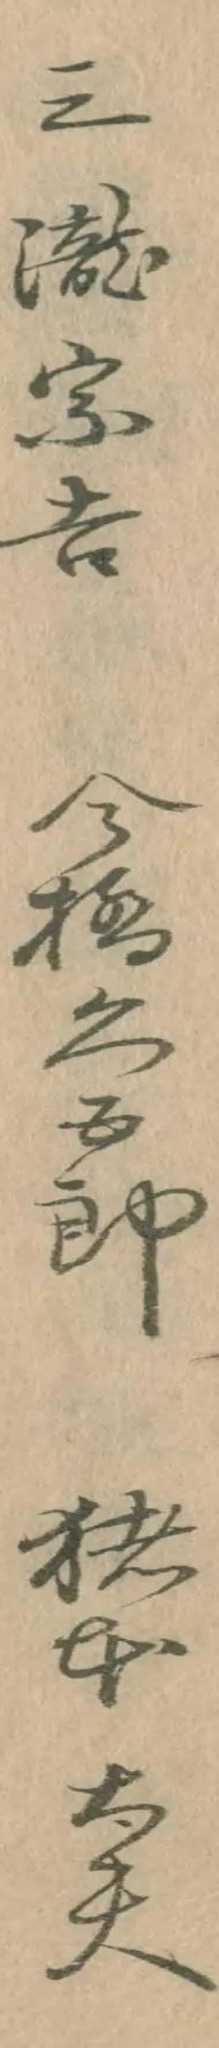三瀧宗吉今橋久五郎猪本大夫
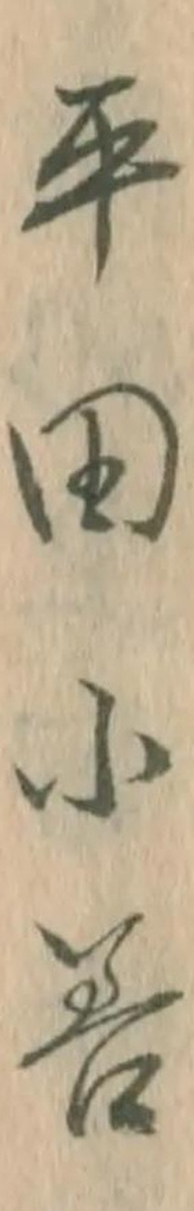平田小善

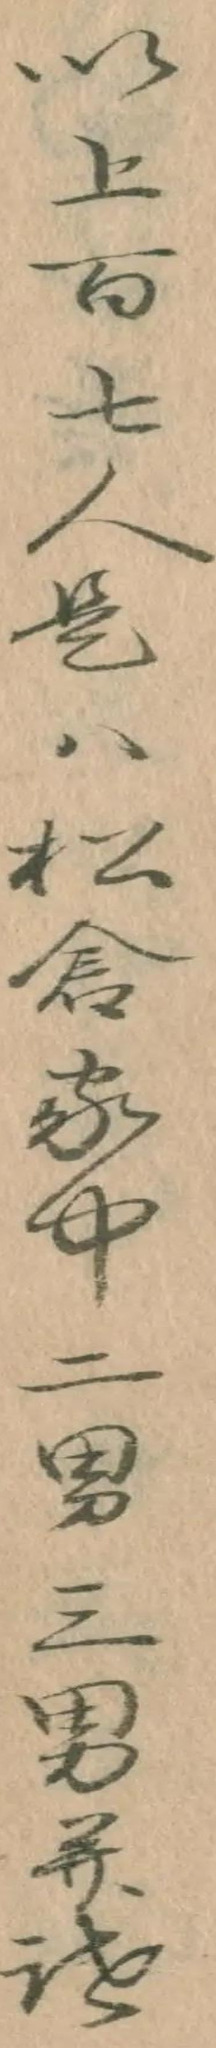以上百七人是は松倉家中二男三男并諸
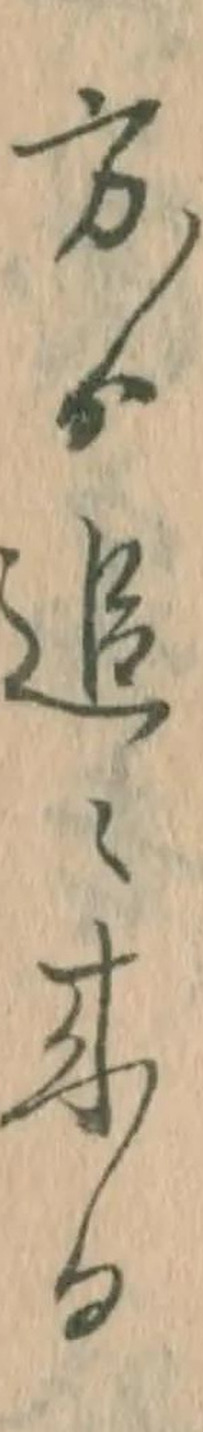方ゟ追々来る
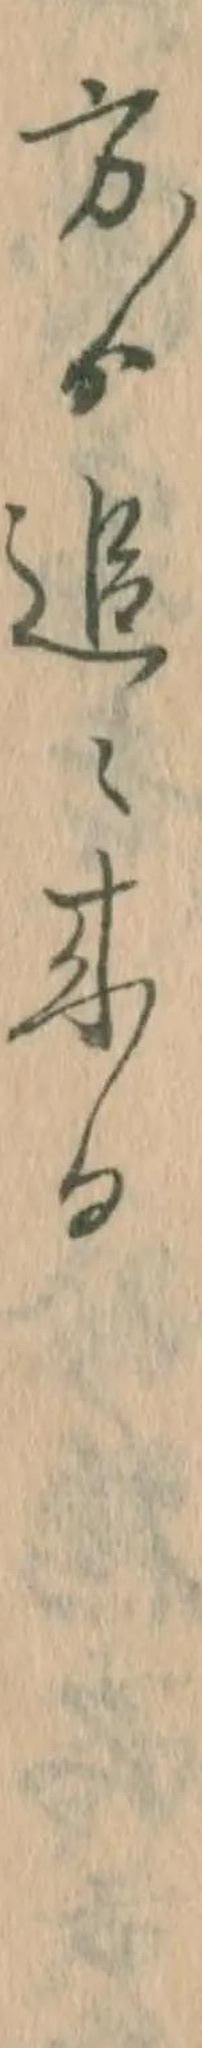方ゟ追々来る
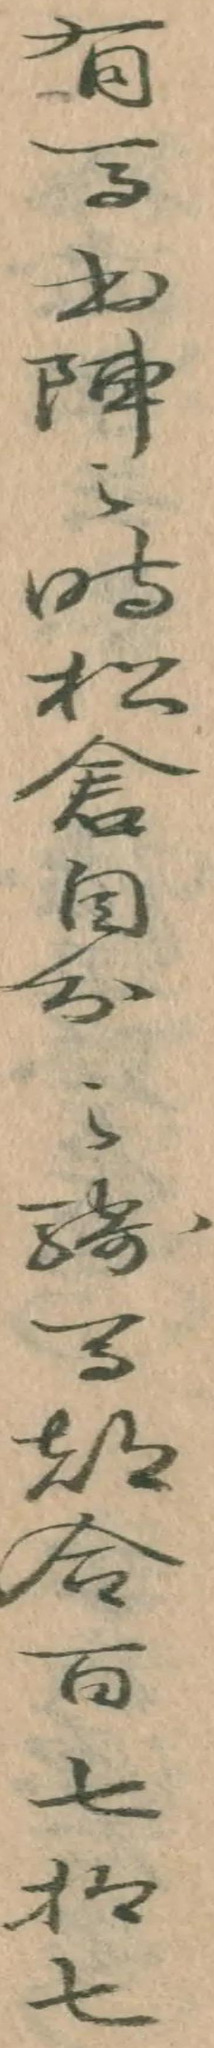有馬出陣之時松倉自分之騎馬都合百七拾七
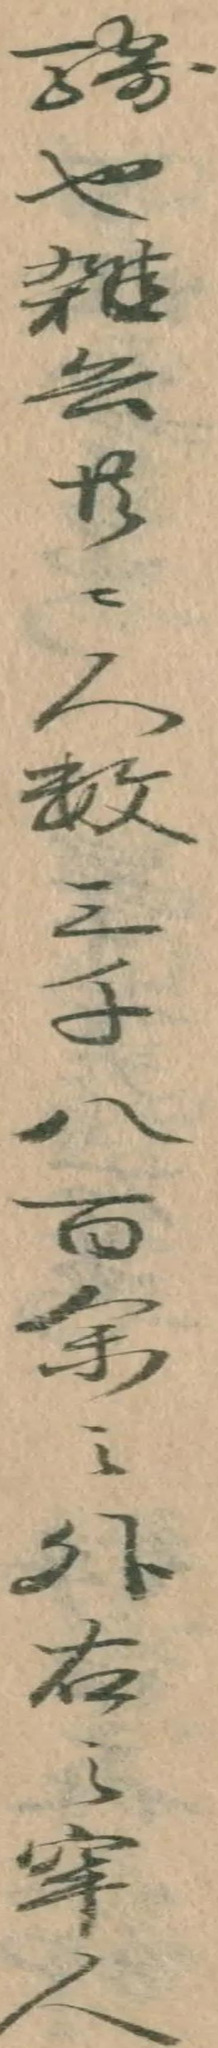騎也雑兵共に人数三千八百余之外右之牢人
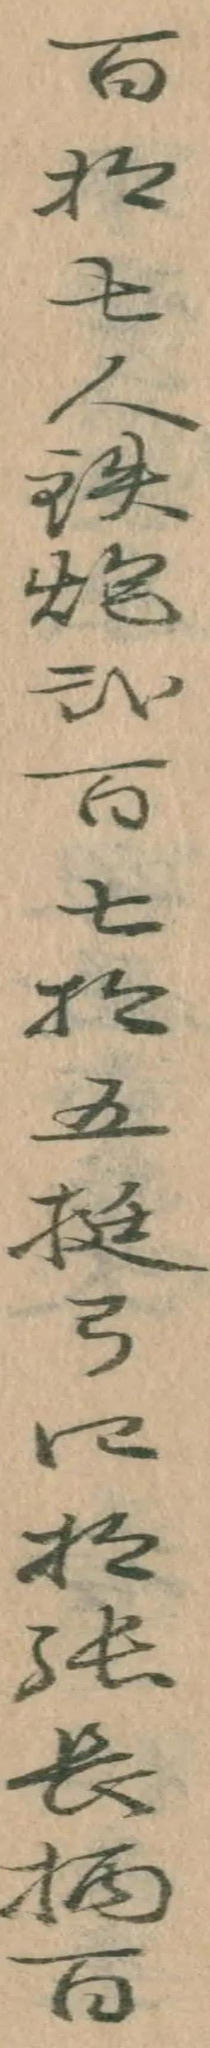百拾七人鉄炮弐百七拾五挺弓四拾張長柄百
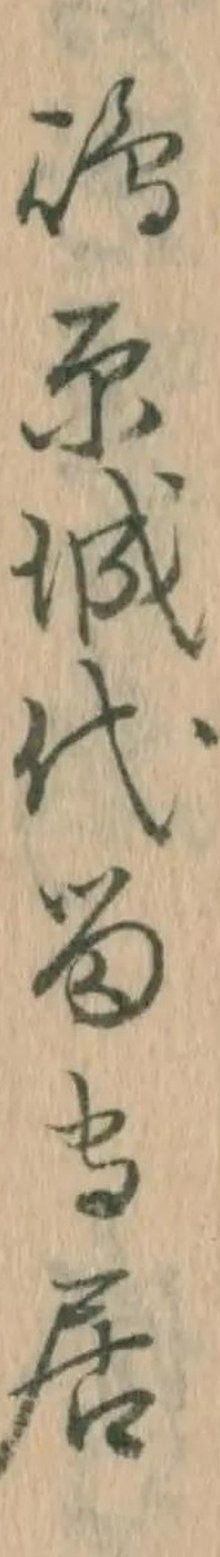島原城代留守居
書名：切支丹御退治記 49巻. [3]
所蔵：国立国会図書館 National Diet Library, JAPAN
